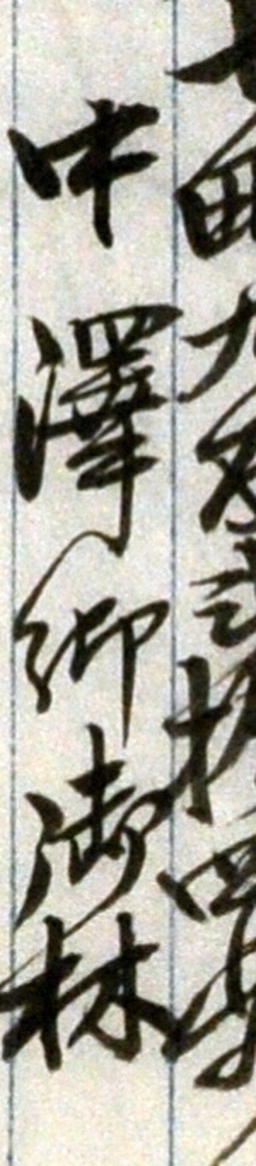中澤郷御林
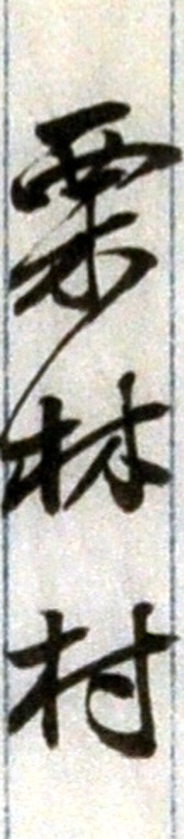栗林村
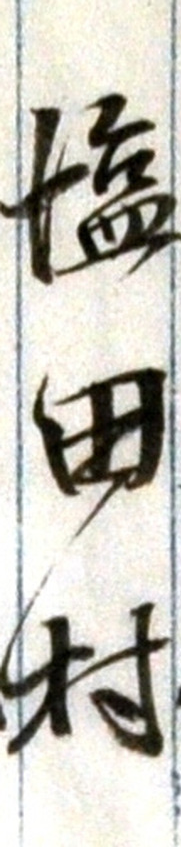塩田村
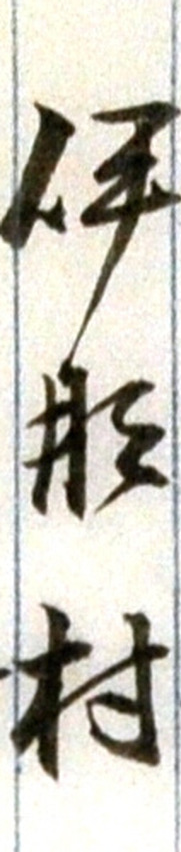伊那村
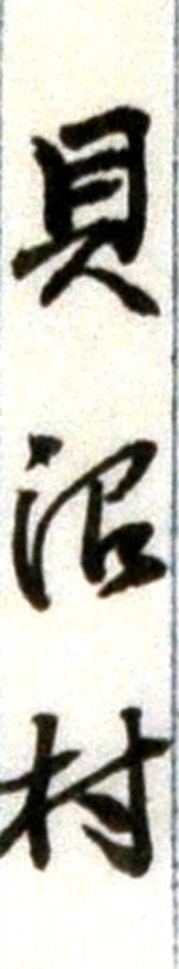貝沼村

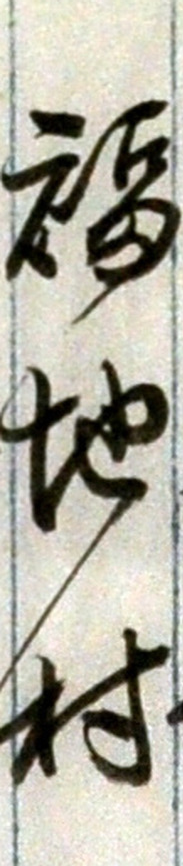福地村
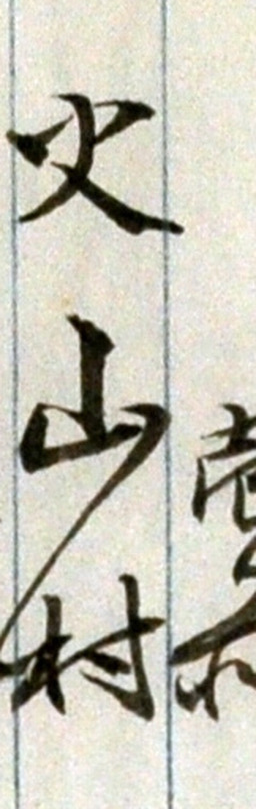火山村
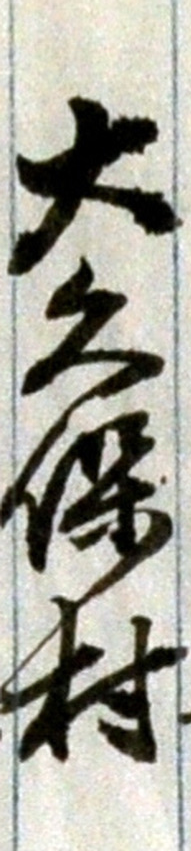大久保村
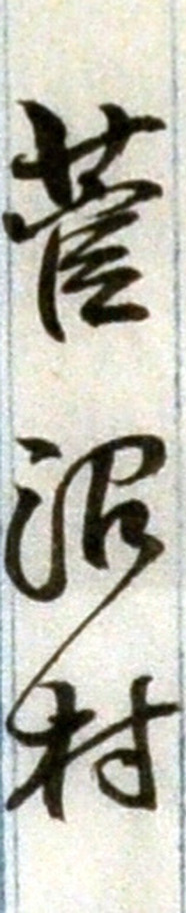菅沼村
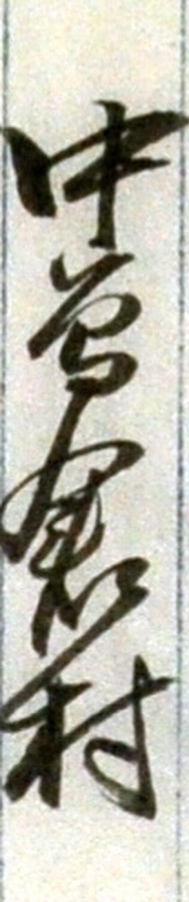中曽倉村
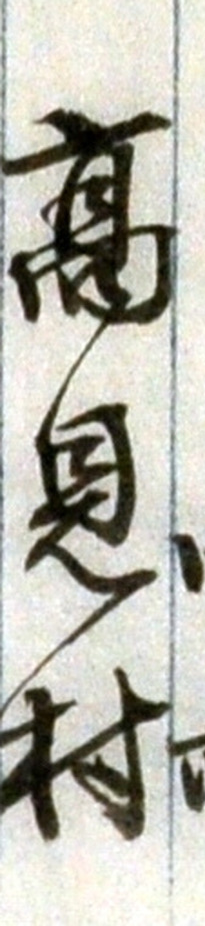高見村

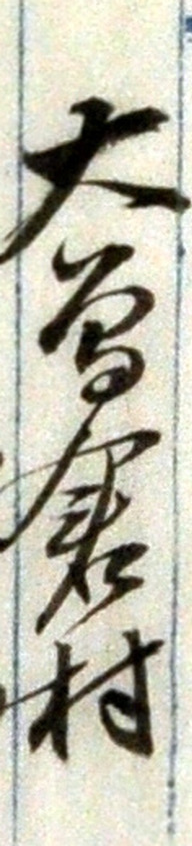大曽倉村
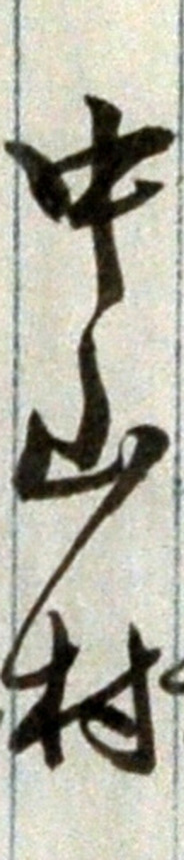中山村
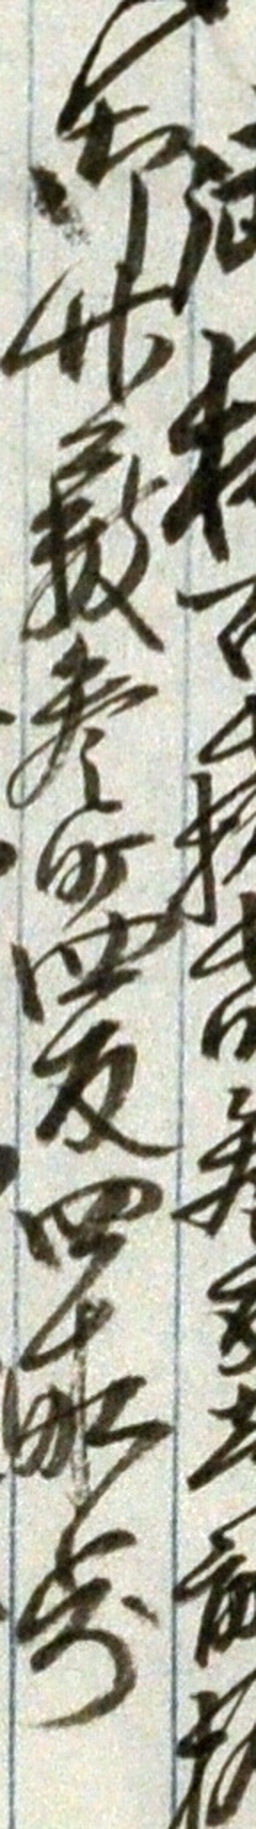御竹藪参町四反四畝歩九ケ所
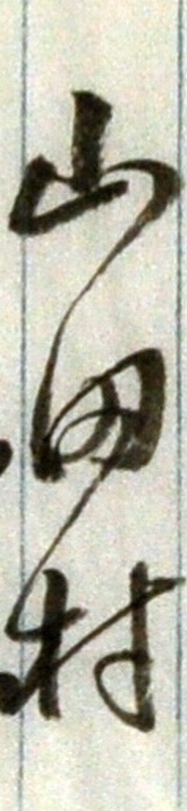山田村
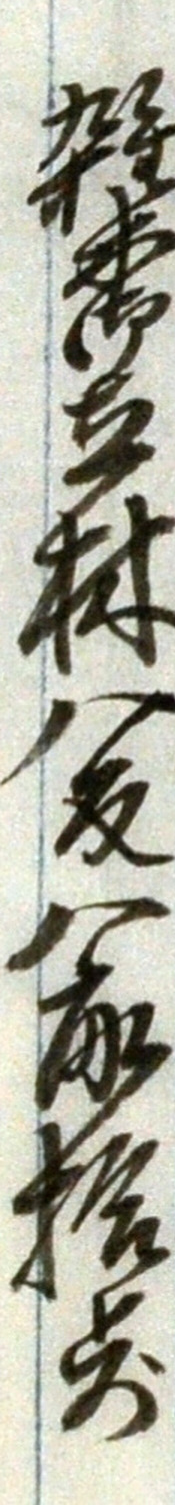雑木御立林八反八畝拾歩弐ケ所
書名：御山帳
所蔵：伊那市立高遠町図書館・合同会社AMANE
